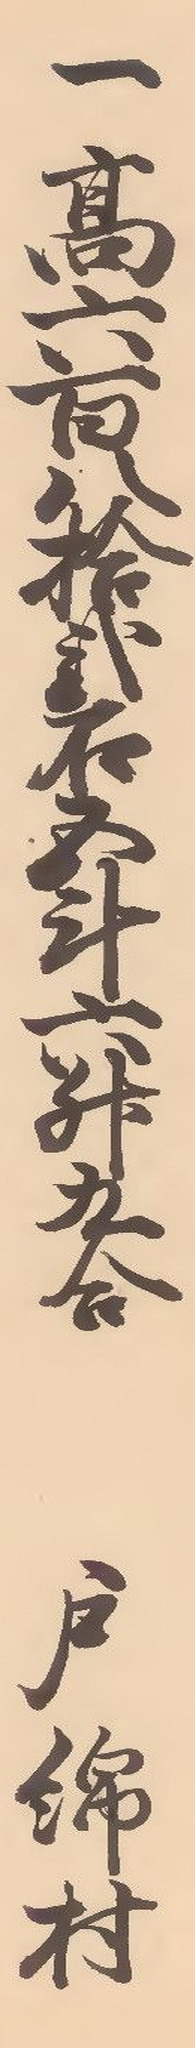一高六百八拾弐石五斗六升九合戸綿村
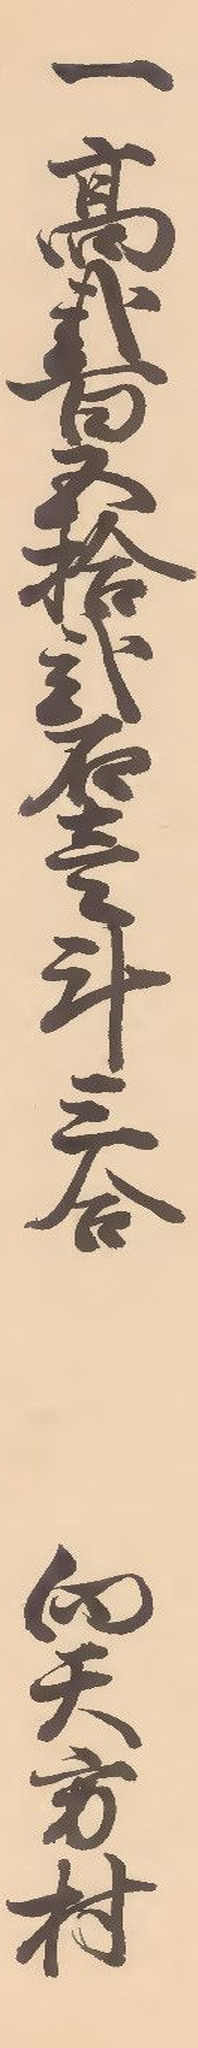一高弐百五拾弐石壱斗三合向天方村
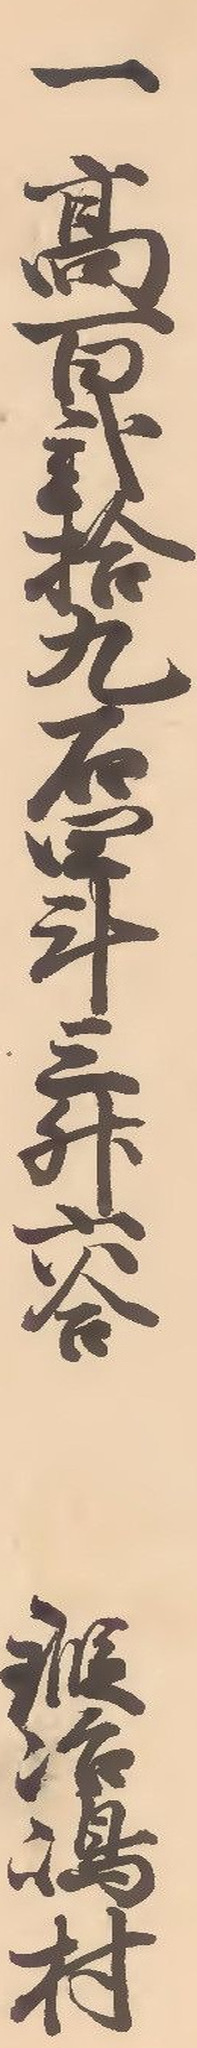一高百弐拾九石四斗三升六合鍛冶島村
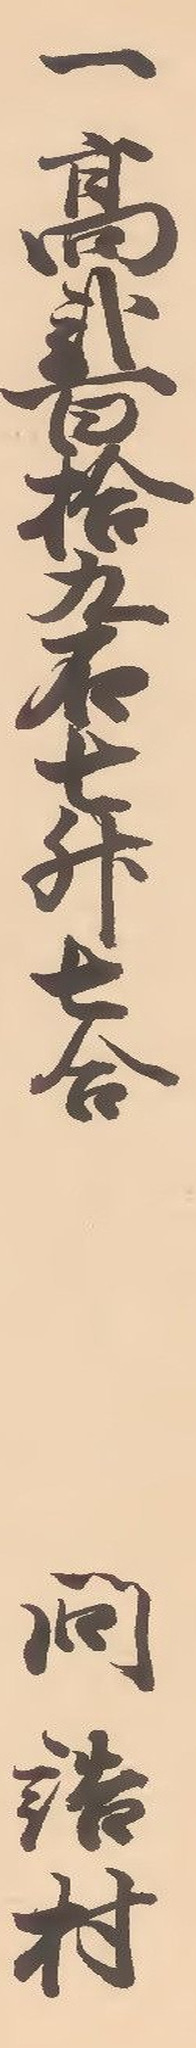一高弐百拾九石七升七合問詰村
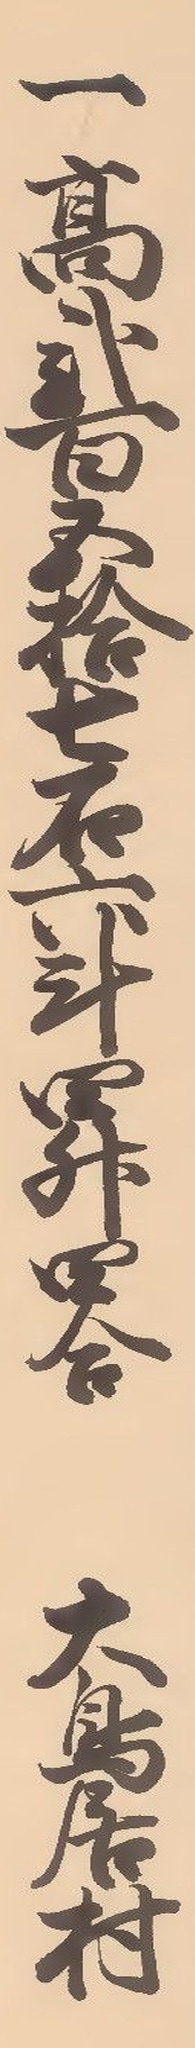一高弐百五拾七石六斗四升四合大鳥居村
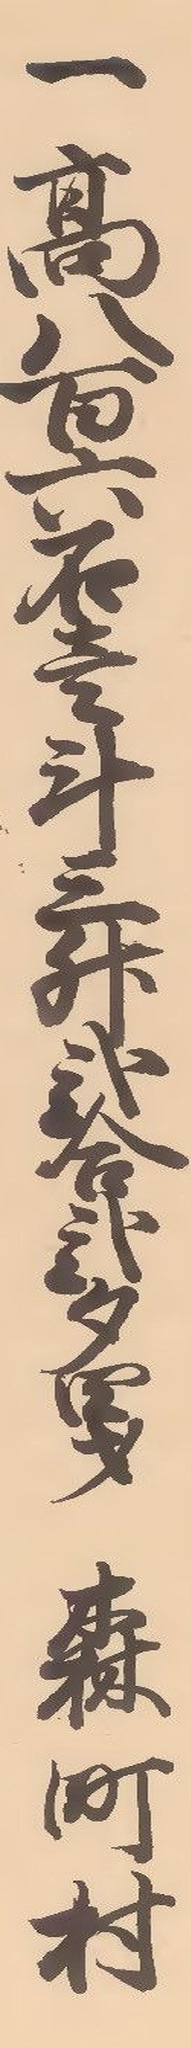一高八百六石壱斗三升弐合弐勺四才森町村
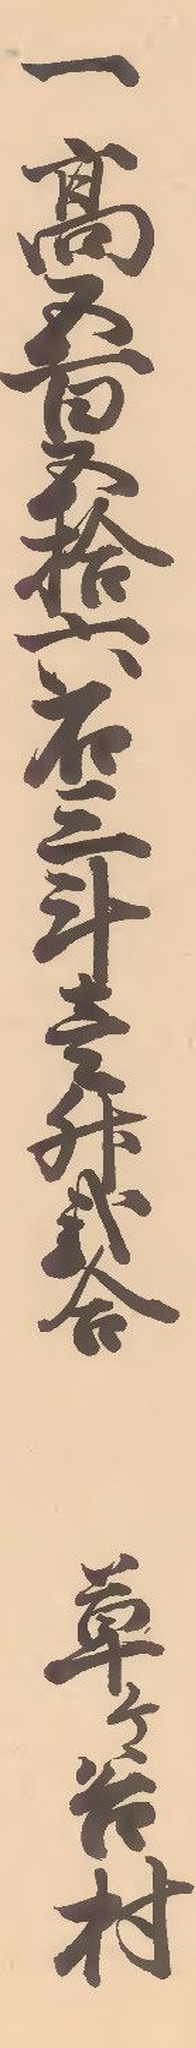一高五百五拾六石三斗壱升弐合草ヶ谷村

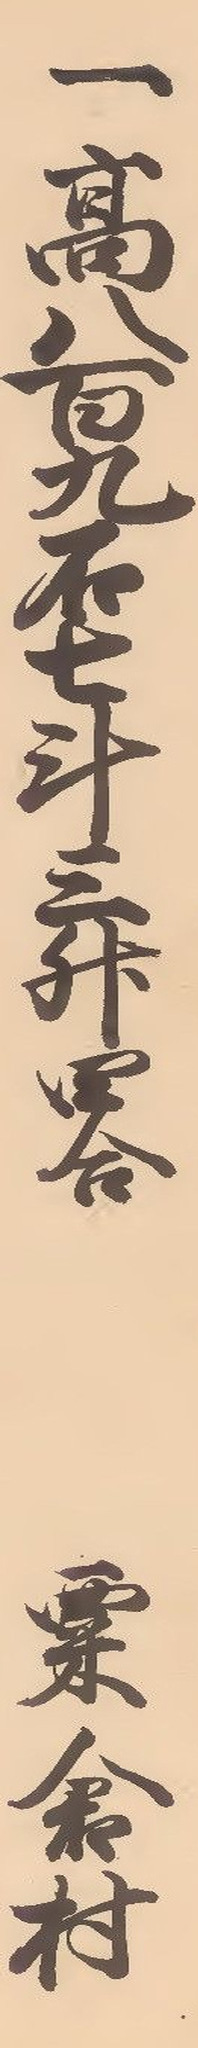一高八百九石七斗三升四合栗倉村
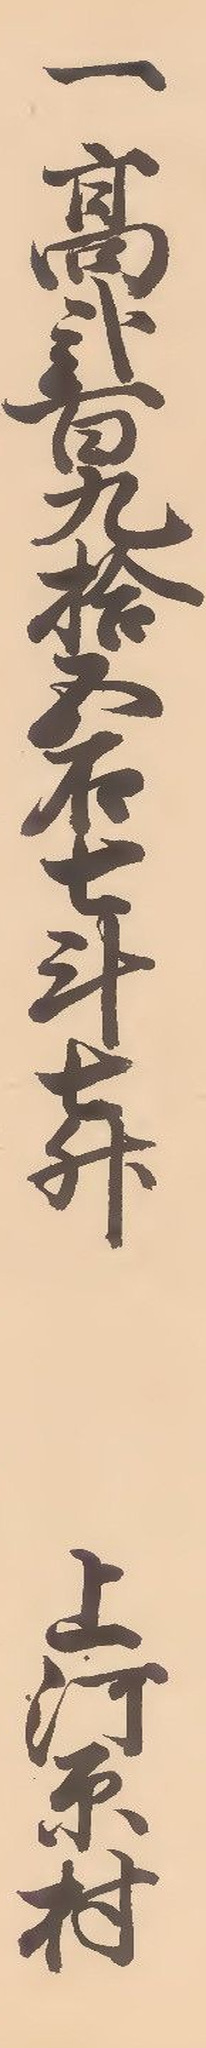一高弐百九拾五石七斗七升上河原村
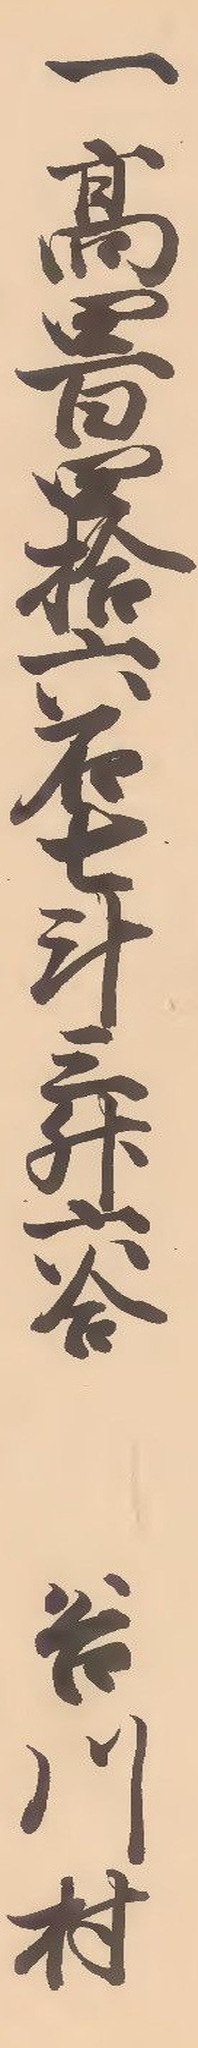一高四百四拾六石七斗三升六合谷川村
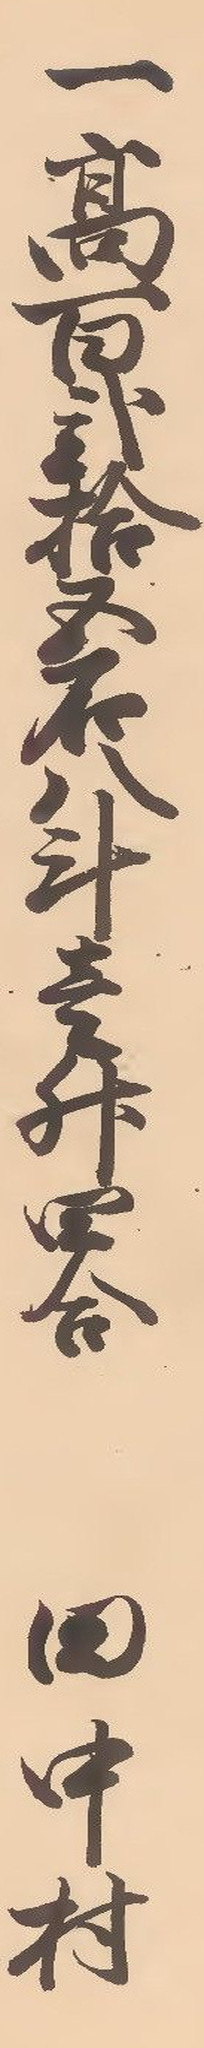一高百弐拾五石八斗壱升四合田中村
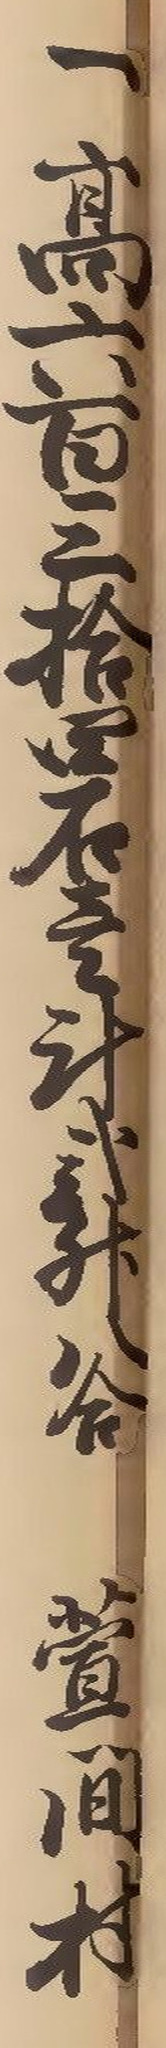一高六百三拾四石壱斗弐升八合萱間村
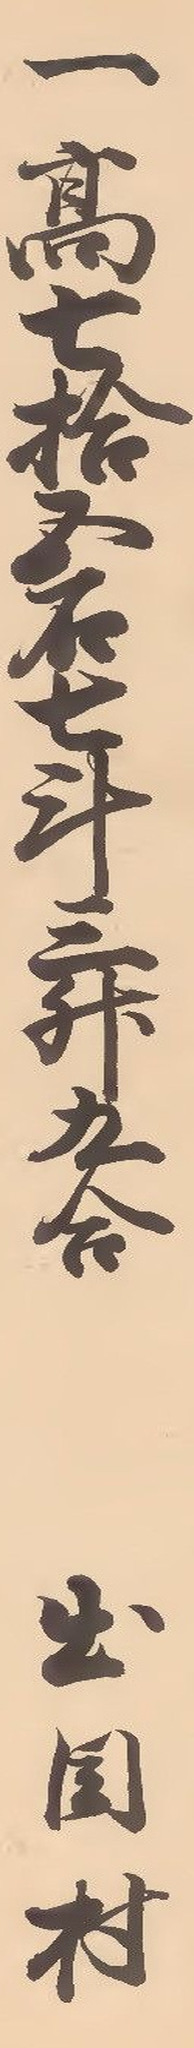一高七拾五石七斗三升九合出目村
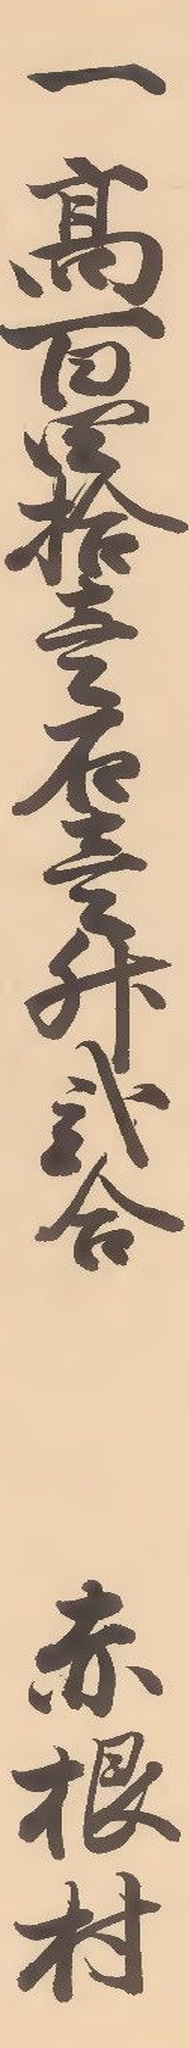一高百四拾壱石壱升弐合赤根村
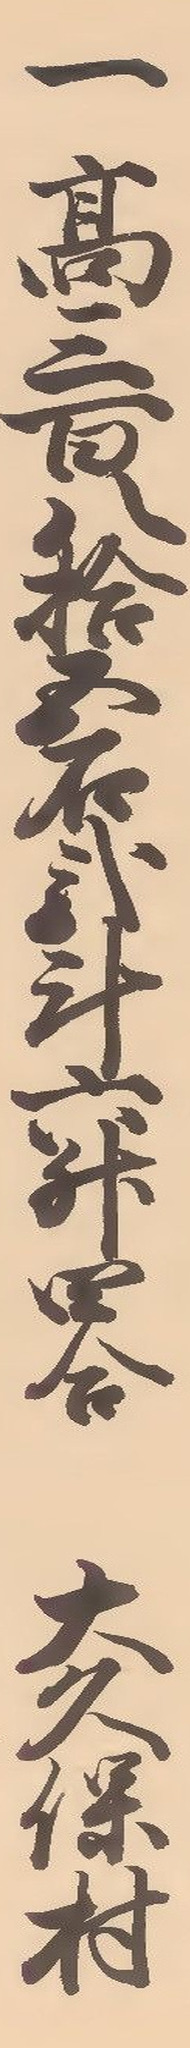一高三百八拾五石弐斗六升四合大久保村

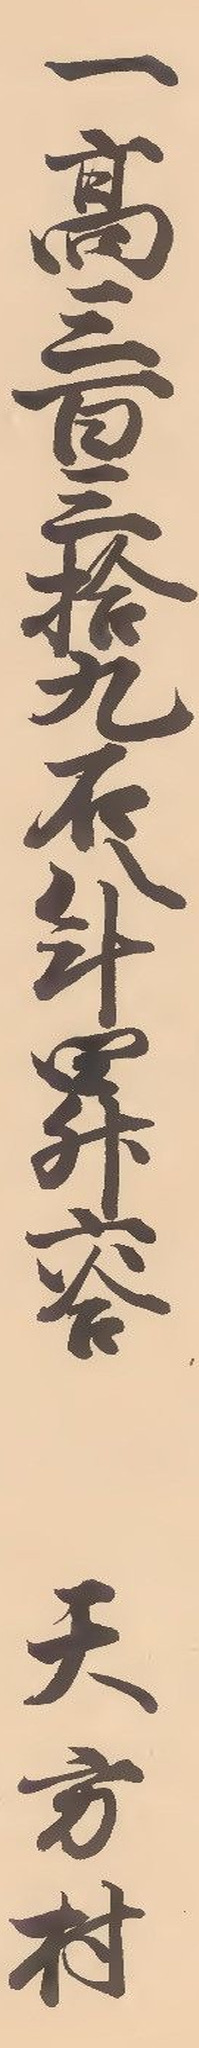一高三百三拾九石八斗四升六合天方村
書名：遠江国郷帳
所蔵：国立公文書館 National Archives of Japan
